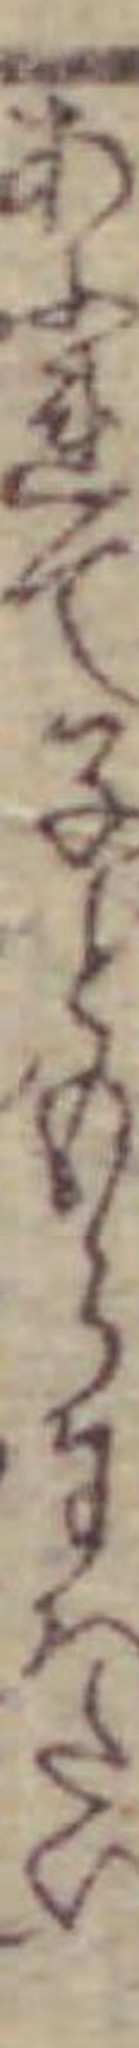あふれて子どもらにはたい
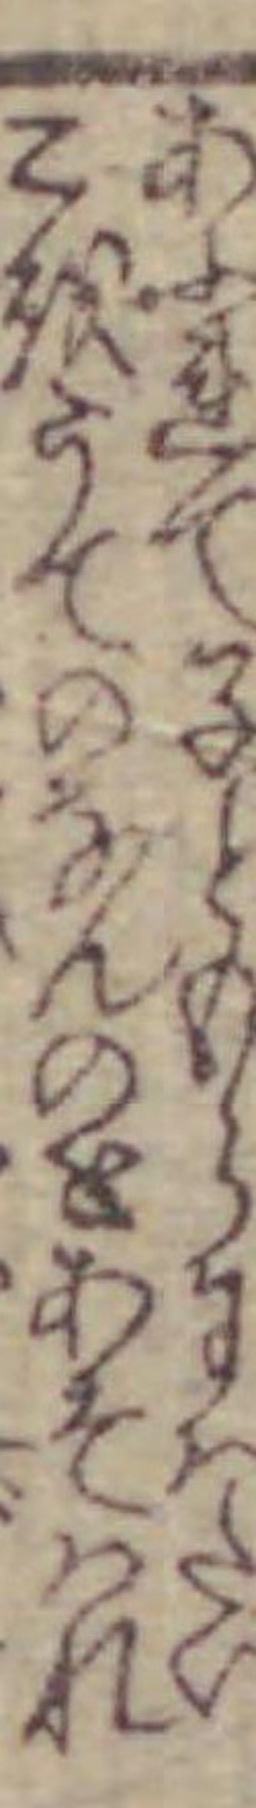こをうてのなんのとあそはれ
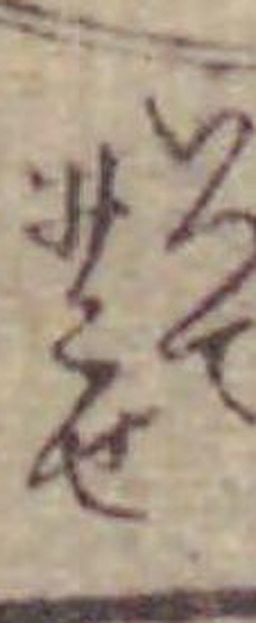おこせ
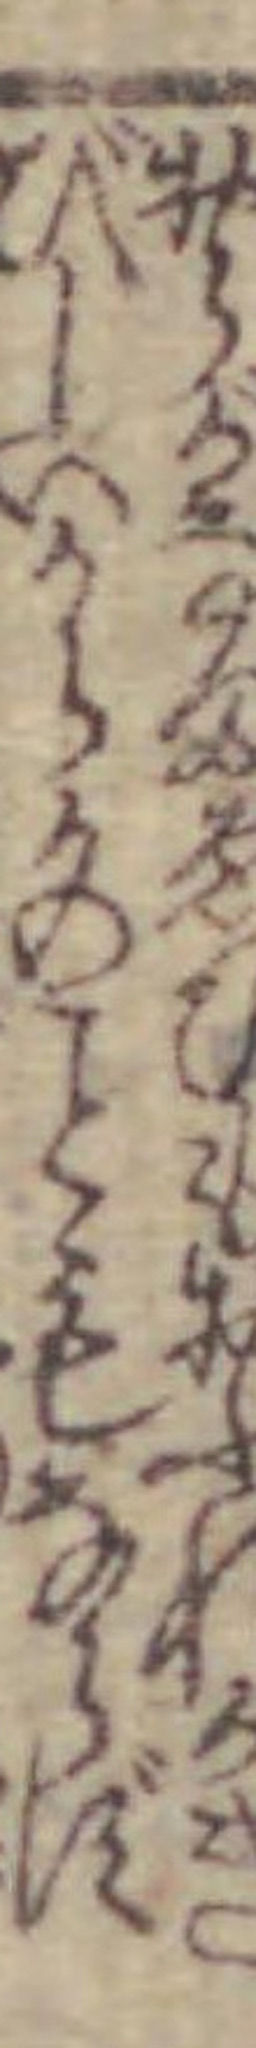びしいからかのこともならず
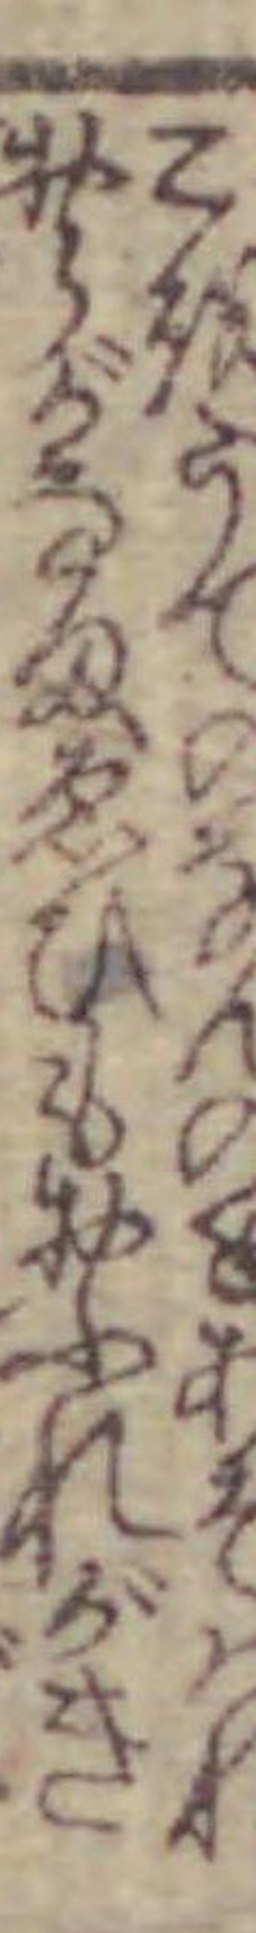おらがなまゑひもおふれがき
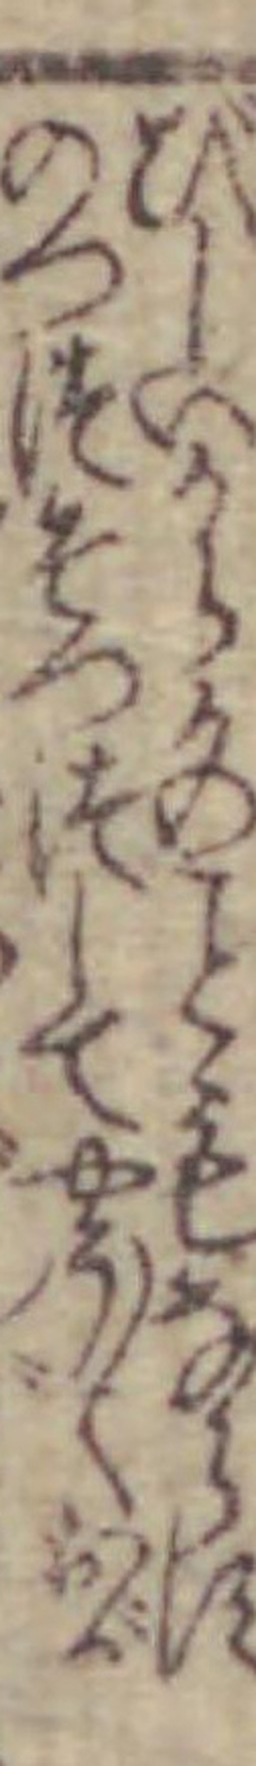のつつそつつしてやう〳〵おが
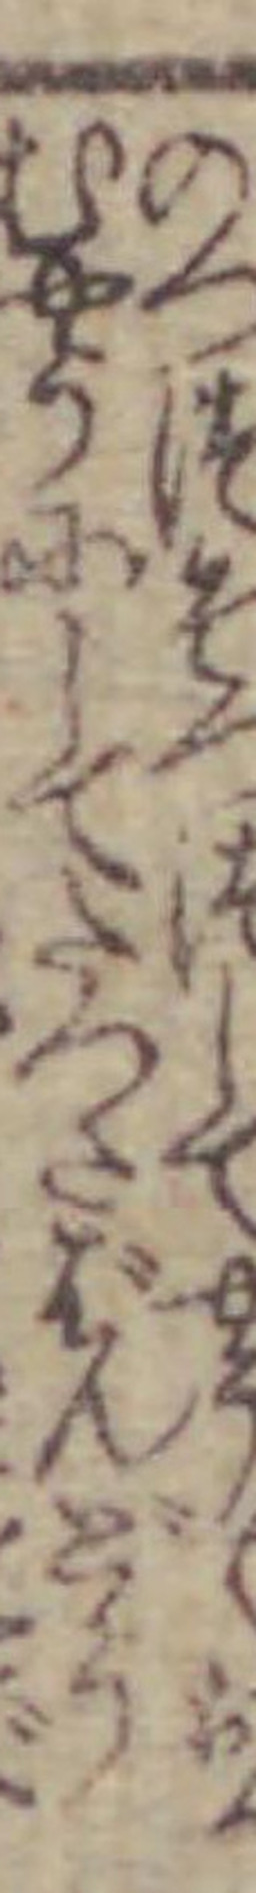むやうにしてたつたばんどう
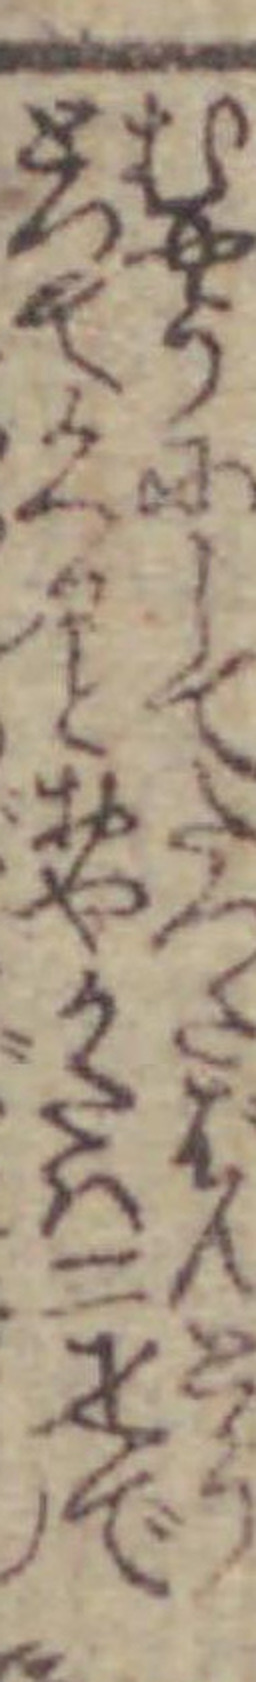とつてかへるとおやかたは二疋？で
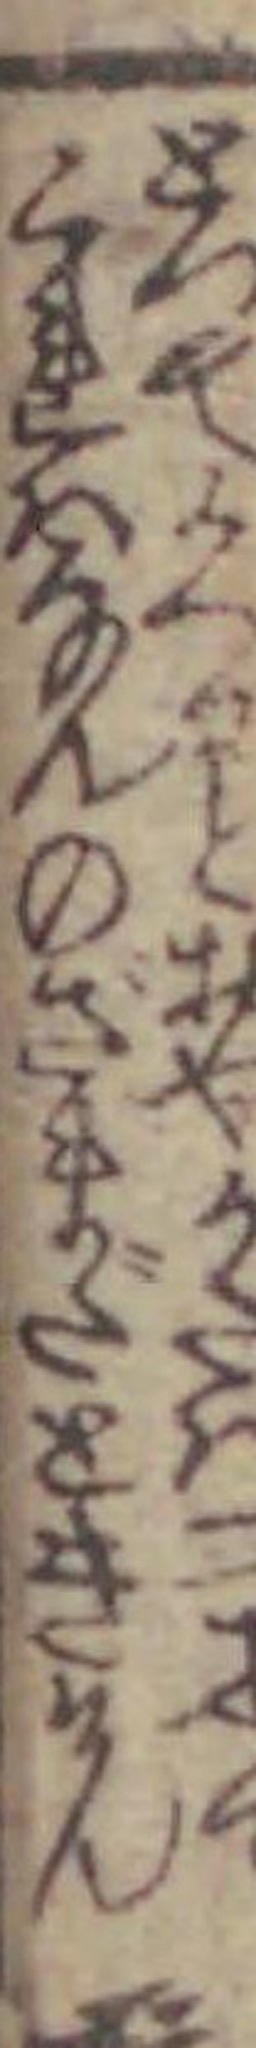これはなんのざまだときけん
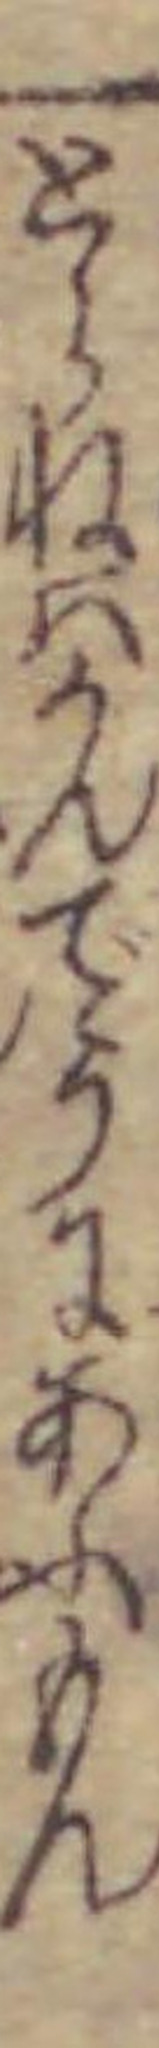とらねはかんでうにあふもん
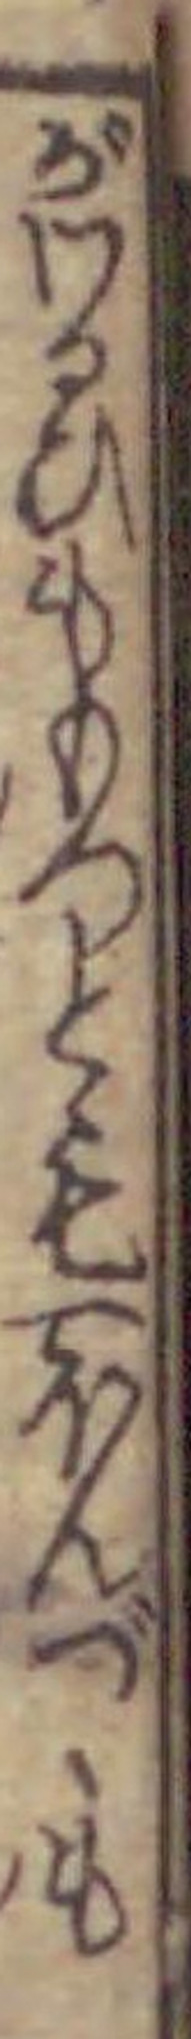がわるひもつとも一ほんづゝも
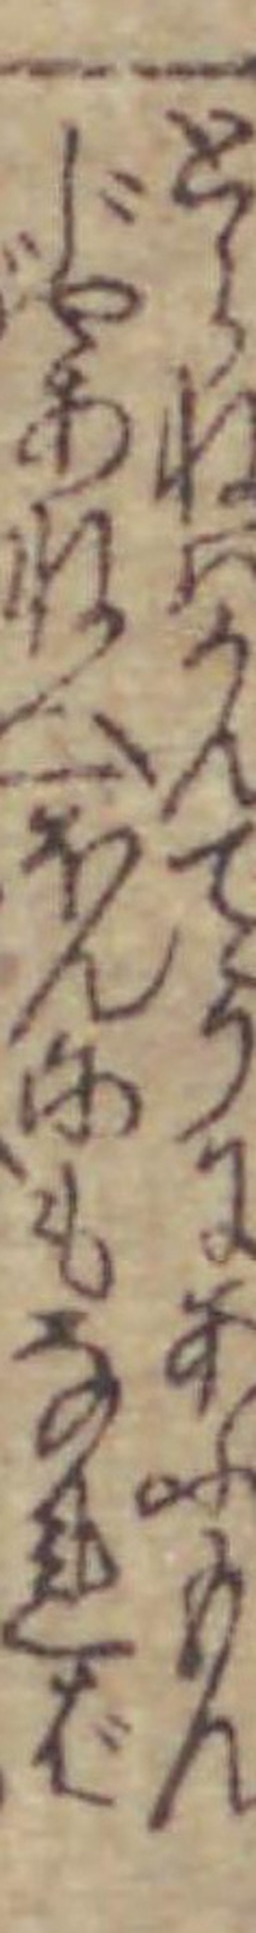じやあねへ一ほんにもなれば
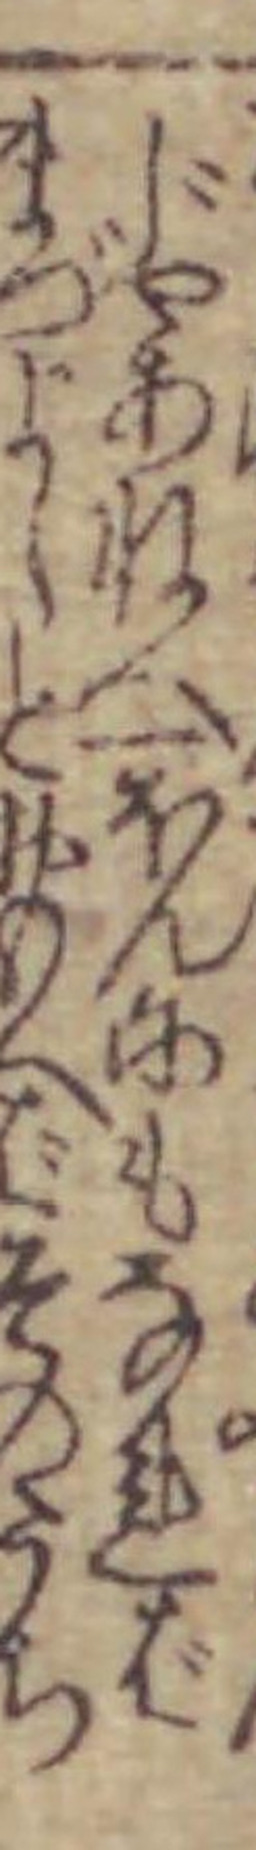まづよしとおもへばそのうち
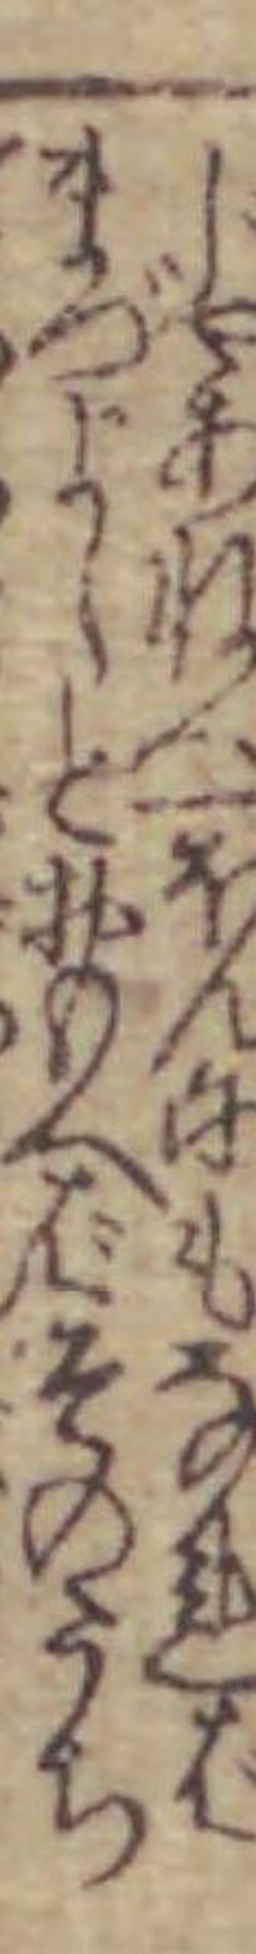まづよしとおもへばそのうち
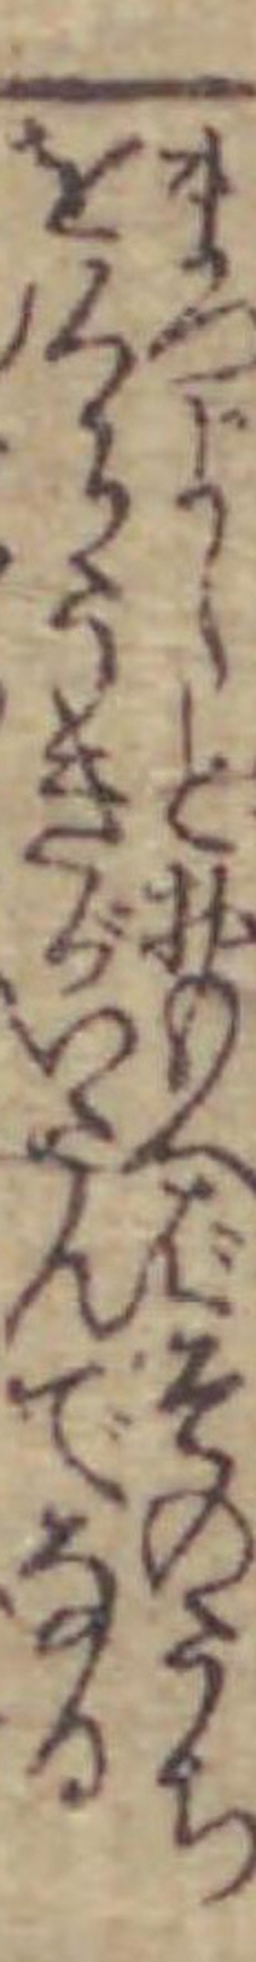をくらうきがいたんでなる
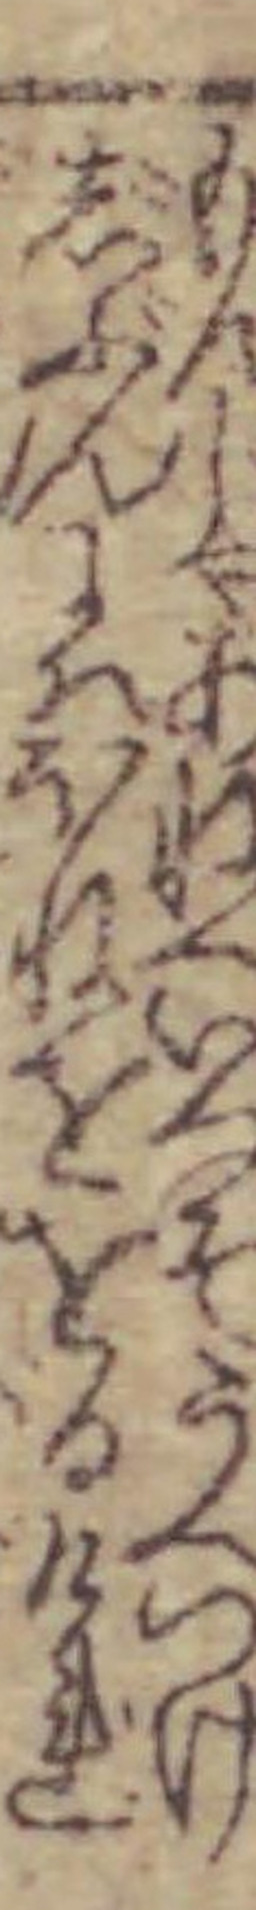じぶんにはほねををるけれ
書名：即席耳学問 : 3巻
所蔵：国立国会図書館 National Diet Library, JAPAN
